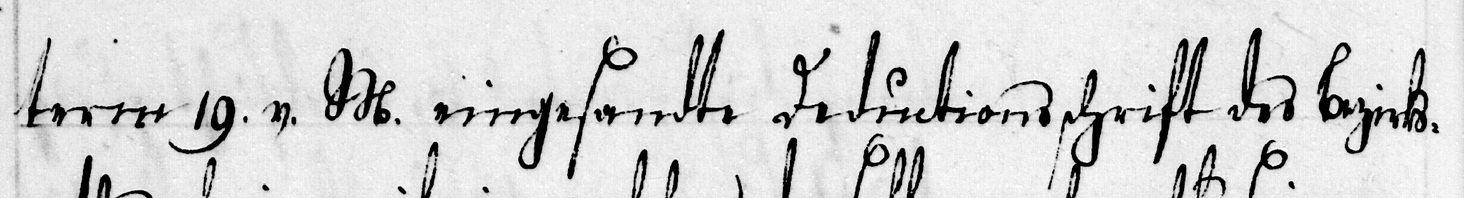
term 19. v. M. eingesandte Deductionsschrift des Bezirk¬
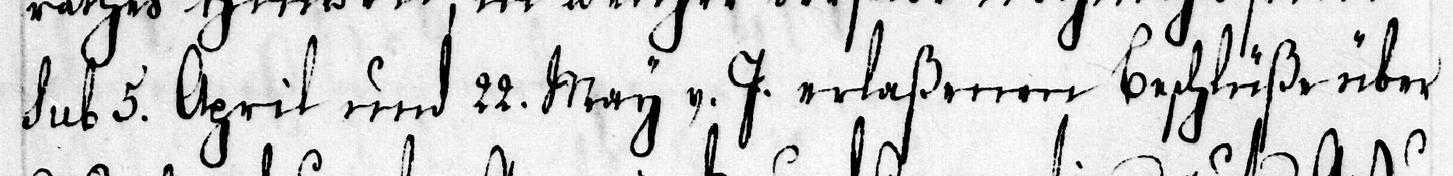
sub 5. April und 22. May v. J. erlaßenen Beschlüße über
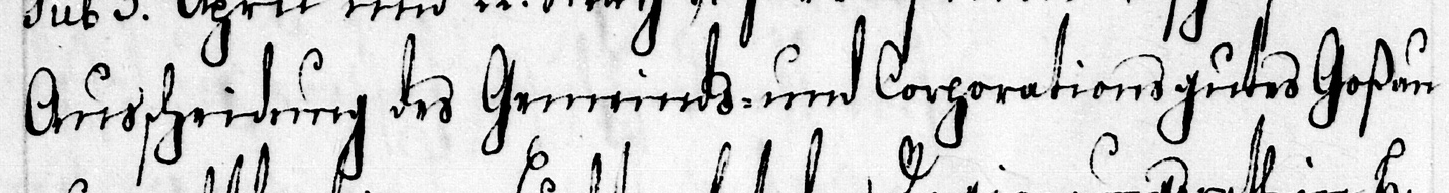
Ausscheidung des Gemeinds- und Corporationsgutes Goßau
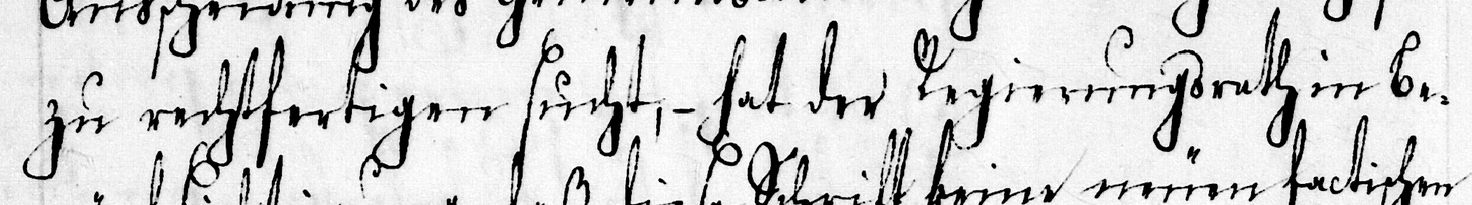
zu rechtfertigen sucht, – hat der Regierungsrath in Be¬
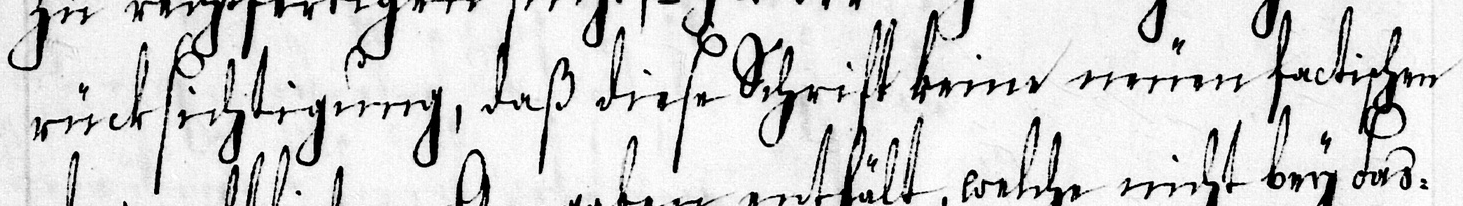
rücksichtigung, daß diese Schrift keine neuen factischen
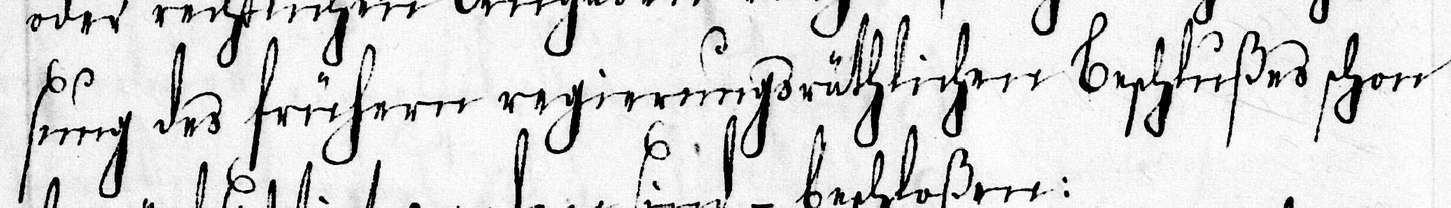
ung des frühern regierungsräthlichen Beschlußes schon
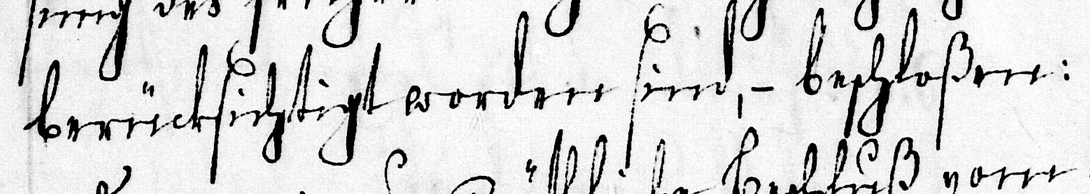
berücksichtigt worden sind, – beschloßen:
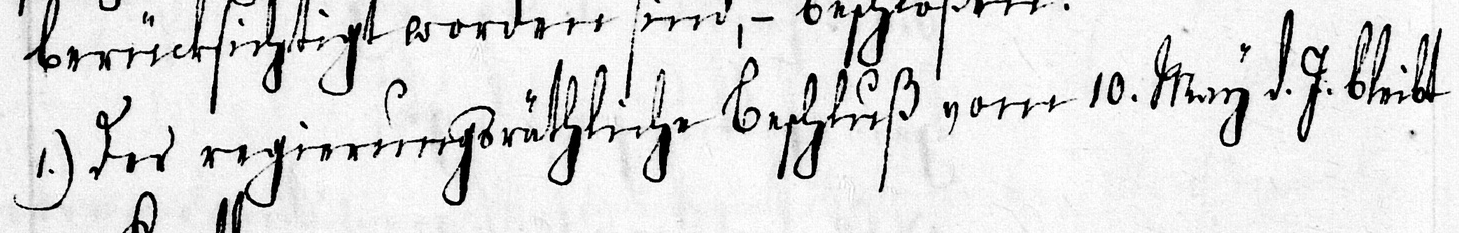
1.) Der regierungsräthliche Beschluß vom 10. May d. J. bleibt
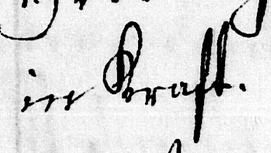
in Kraft.
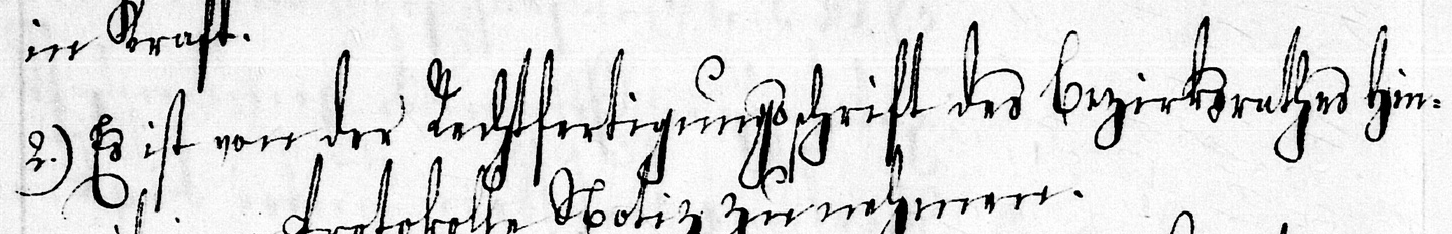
Es ist von der Rechtfertigungsschrift des Bezirksrathes Hi¬
